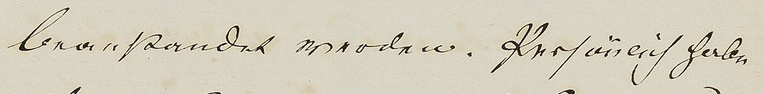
beanstandet werden. Persönlich habe
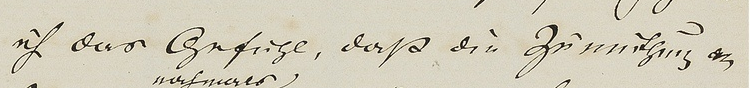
ich das Gefühl, daß die Zumuthung an
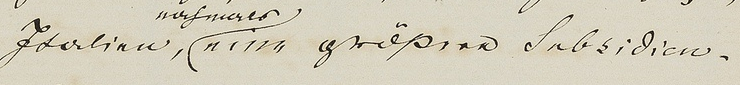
Italien, nochmals eine größere Subsidien -
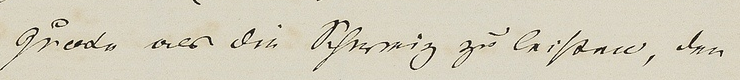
quote als die Schweiz zu leisten, den
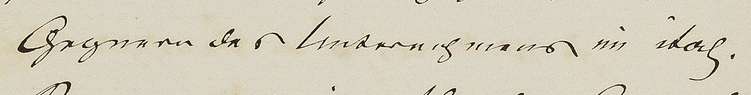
Gegnern des Unternehmens im ital.
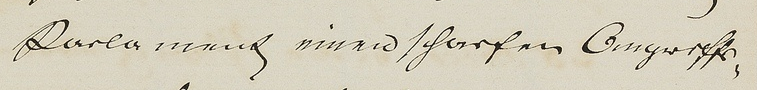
Parlament einen scharfen Angriffs-
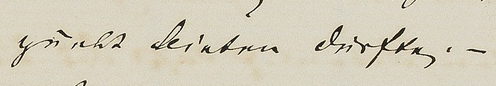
punkt bieten dürfte. –
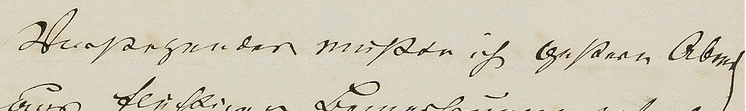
Vorstehendes mußte ich gestern Abend
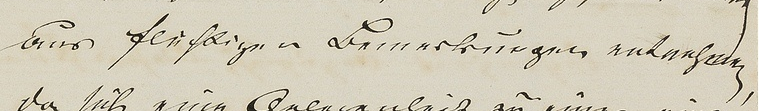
aus flüchtigen Bemerkungen entnehmen,
